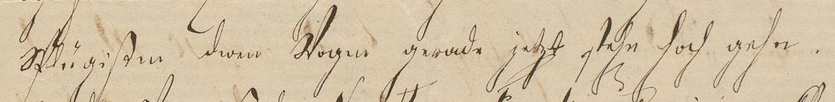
Splügisten deren Wogen gerade jetzt sehr hoch gehn.
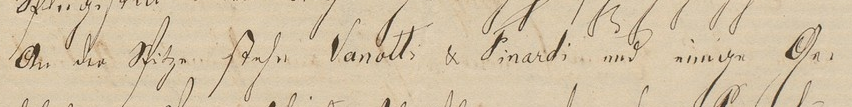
An der Spitze stehn Vanotti & Sinardi und einige Ge-
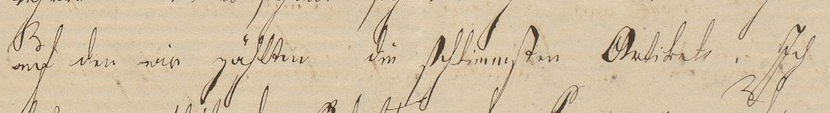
auf den wir zählten die schlimmsten Artikel. Ich
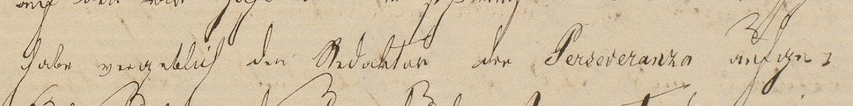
habe vergeblich den Redaktor der Perseveranza aufge-
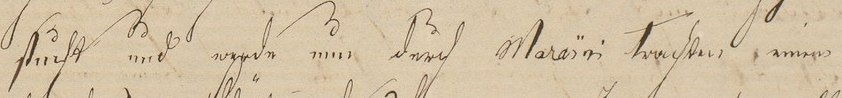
sucht und werde nun durch Maraïni trachten einem
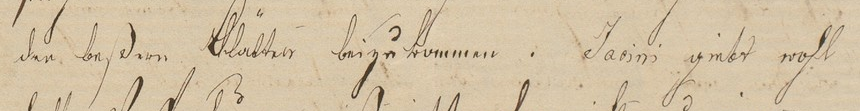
der beßern Blätter beizukommen. Jacini giebt wohl
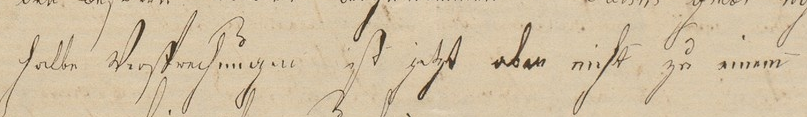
halbe Versprechungen ist jetzt aber nicht zu einem
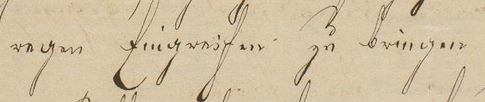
regen Eingreifen zu bringen.
